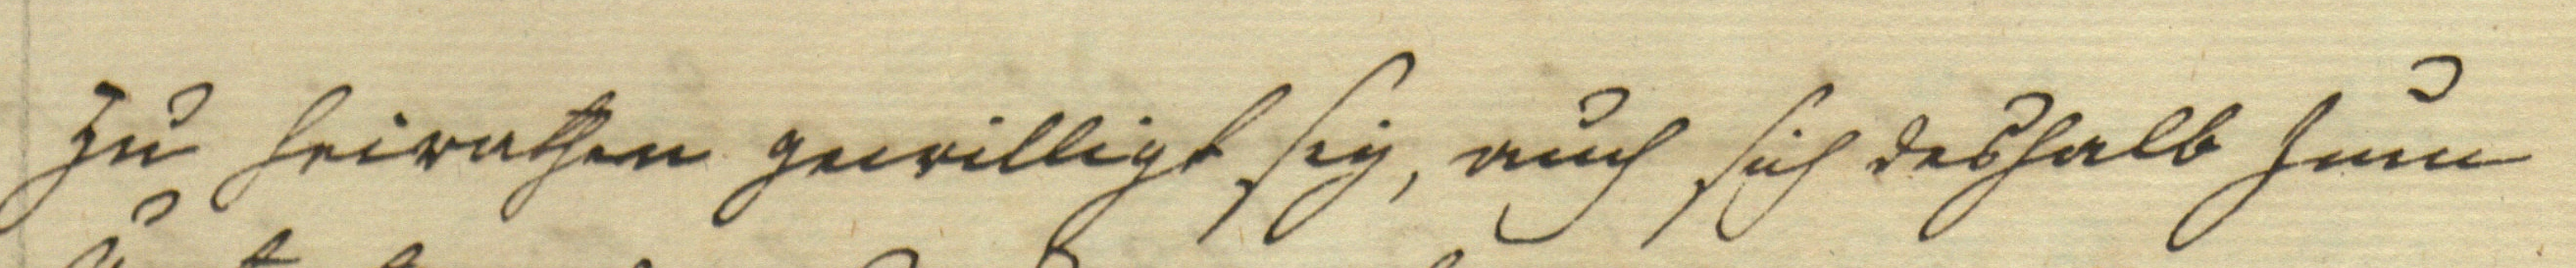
zu heirathen gewilligt seÿ, auch sich deshalb zum
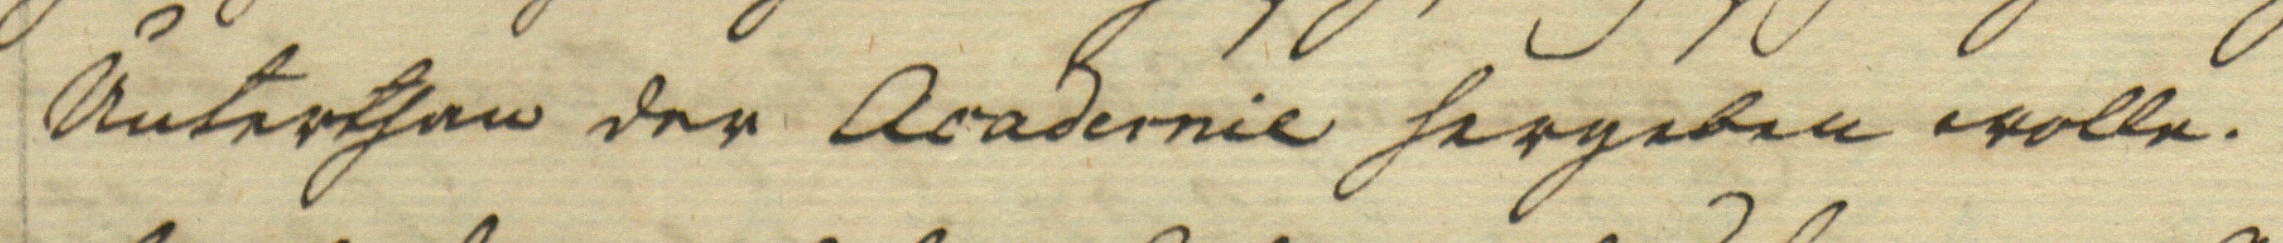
Unterthan der Academie hergeben wolle.
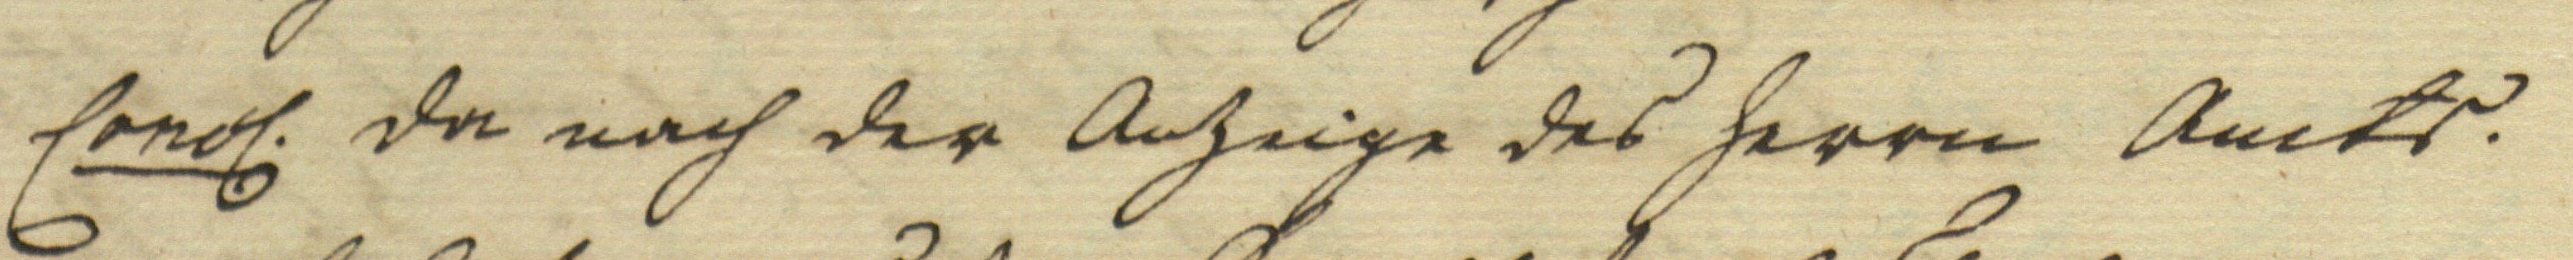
Concl. Da nach der Anzeige des Herrn Amts¬
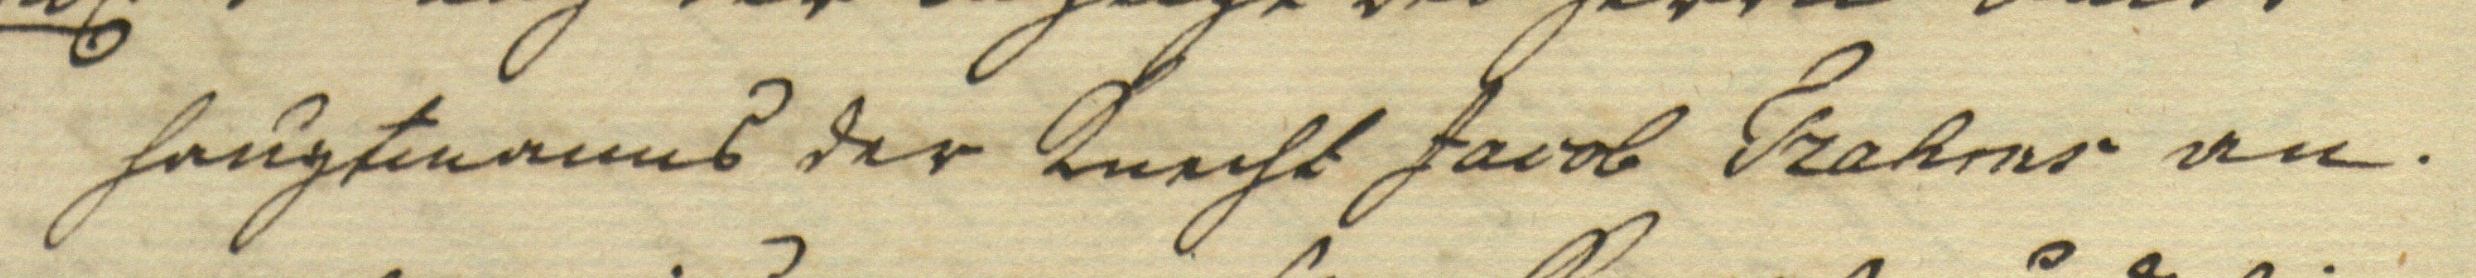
hauptmanns der Knecht Jacob Trahms an¬
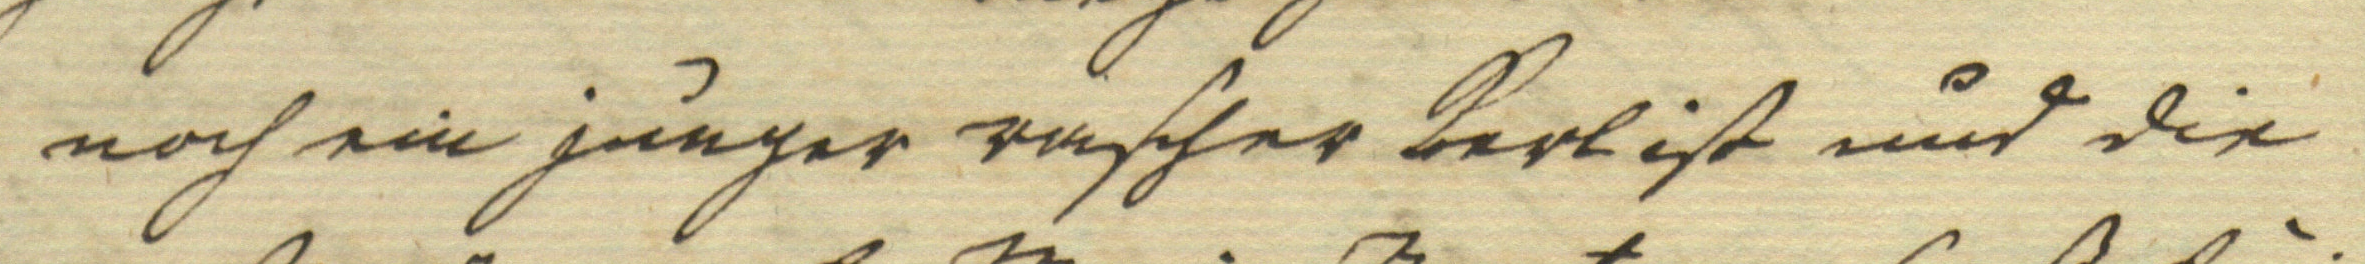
noch ein junger rascher Kerl ist und die
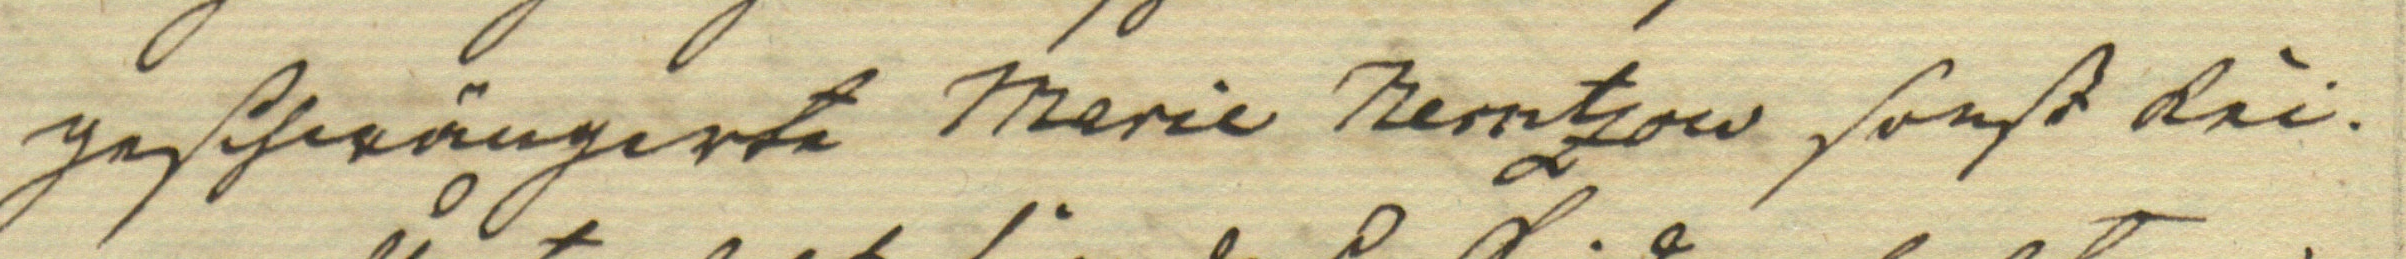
geschwängerte Merie Nemtzow sonst kei¬
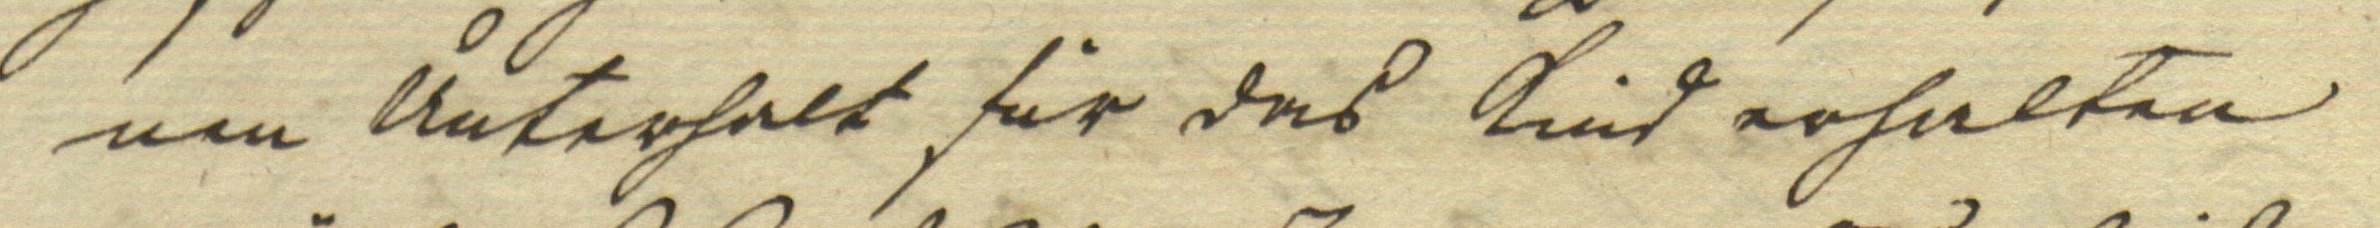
nen Unterhalt für das Kind erhalten
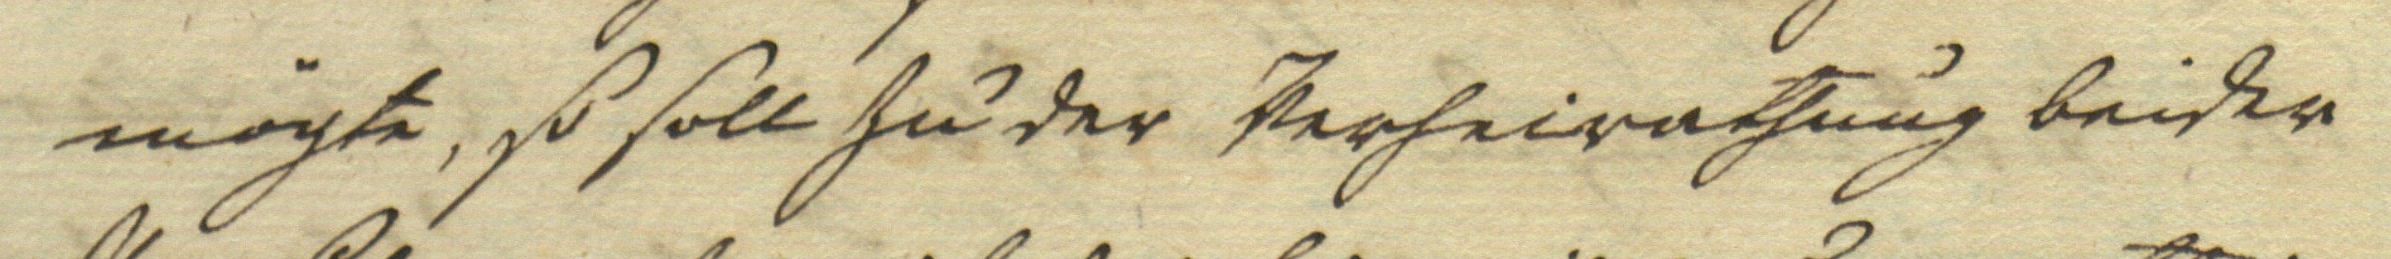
mögte, so soll zu der Verheirathung beider
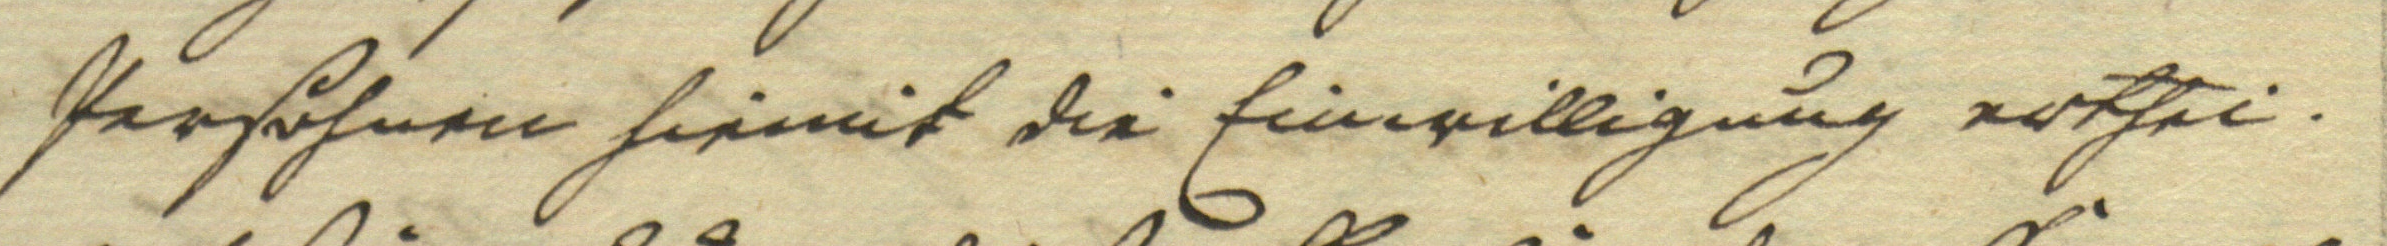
Persohnen hiemit die Einwilligung erthei¬
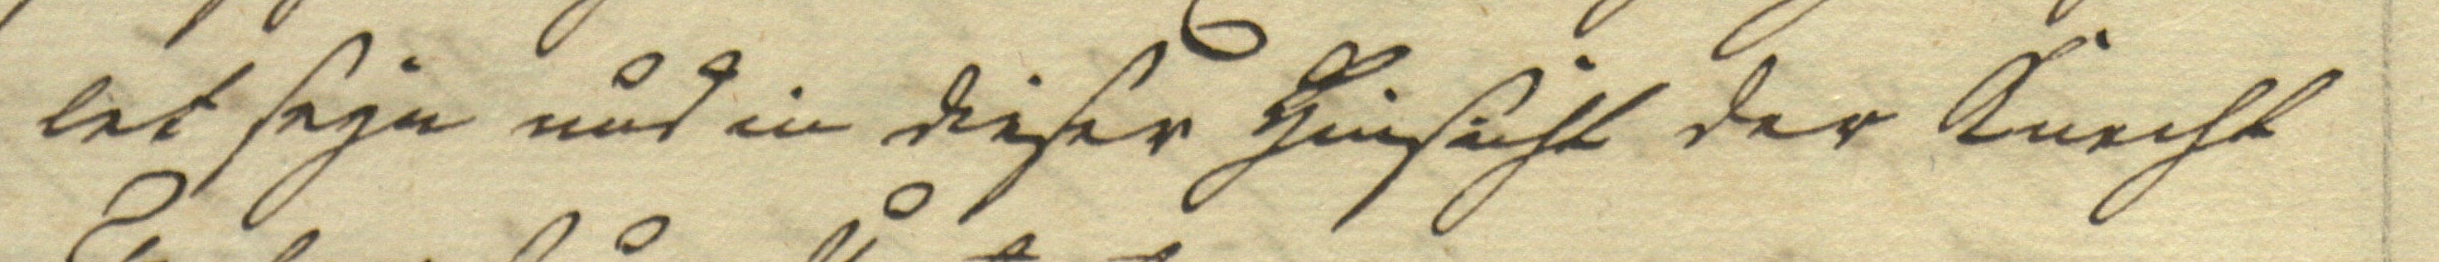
let seÿn und in dieser Hinsicht der Knecht
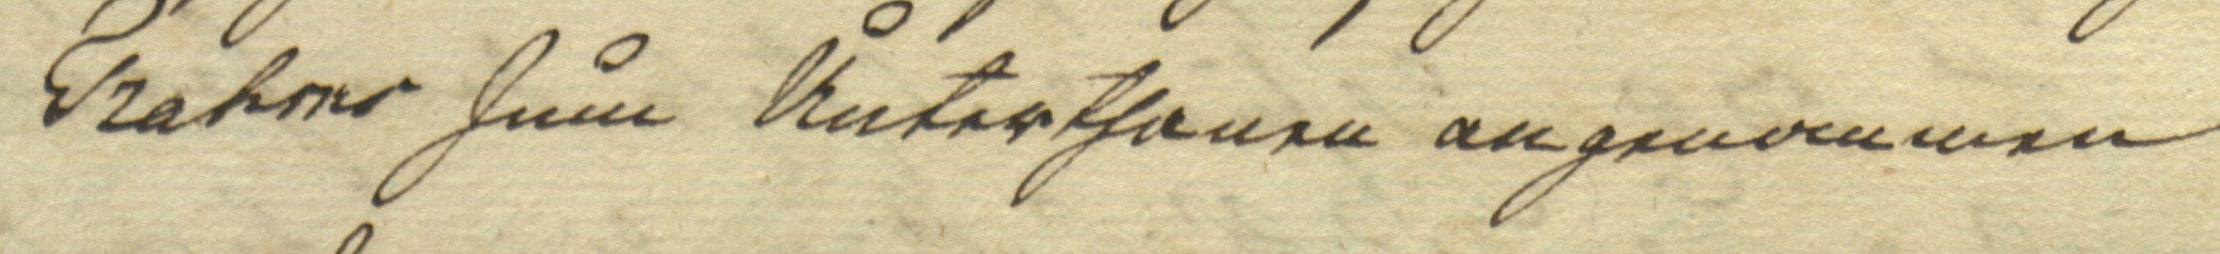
Trahms zum Unterthanen angenommen
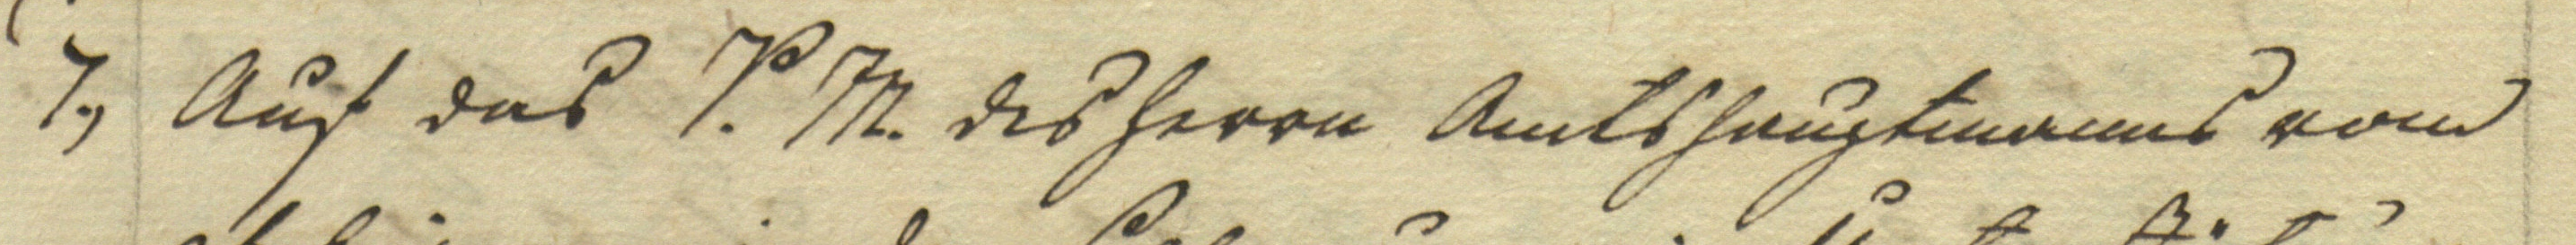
7., Auf das P. M. des Herrn Amtshauptmanns vom
